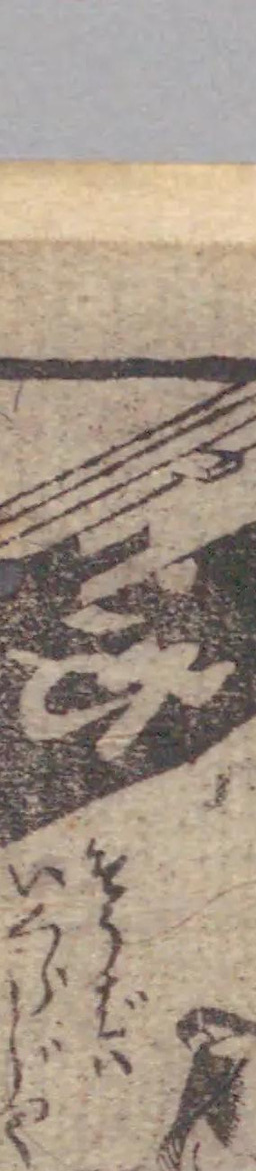いくらじや
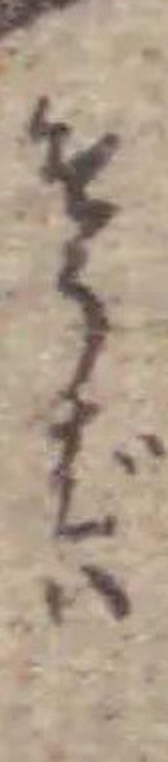そうばは
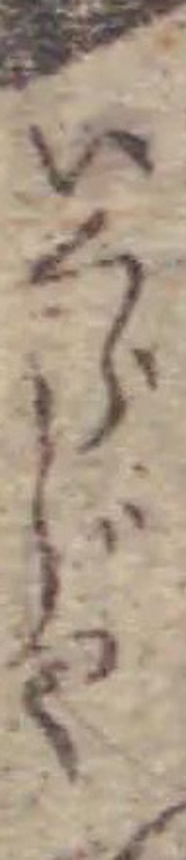いくらじや
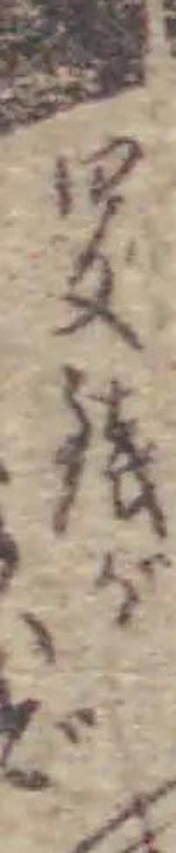四文銭が
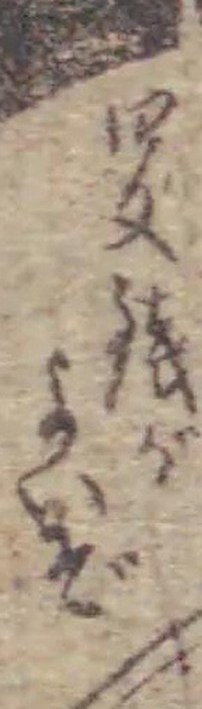四文銭が
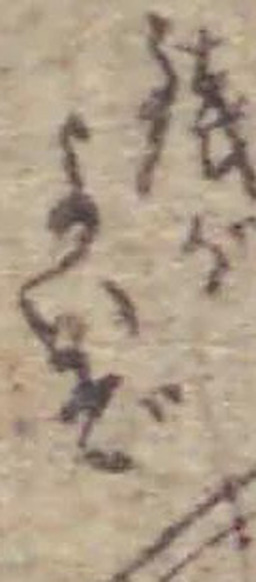よいぞ

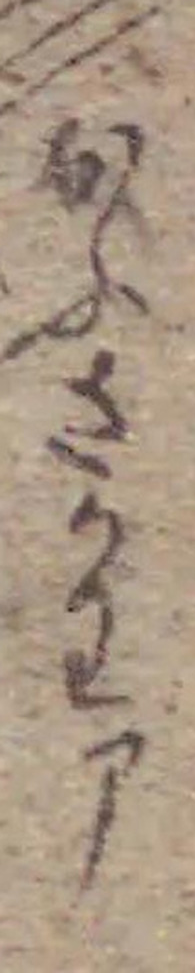おふさかわァ
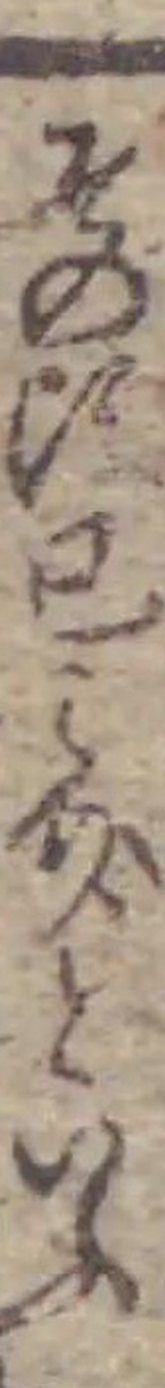その頃巳之介といふ
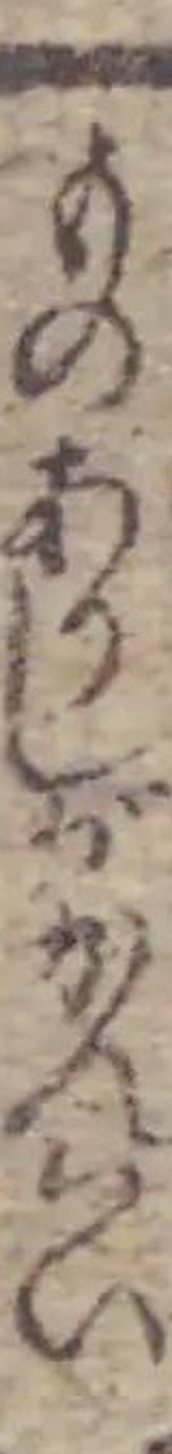ものありしがかんらい
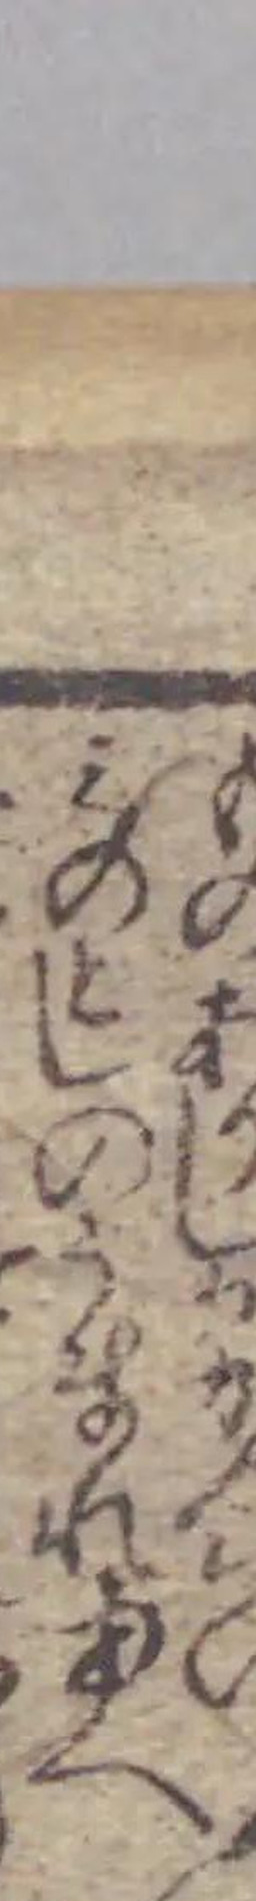みのとしのうまれゆへ
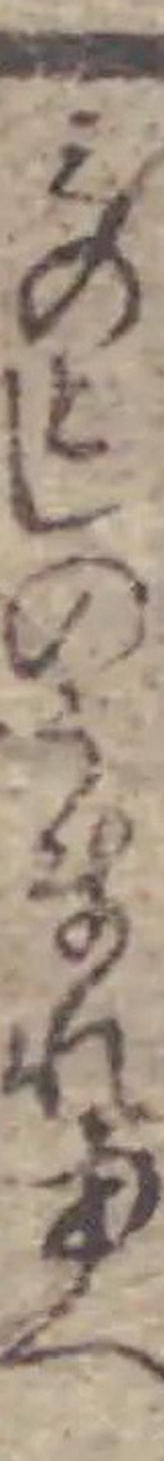みのとしのうまれゆへ
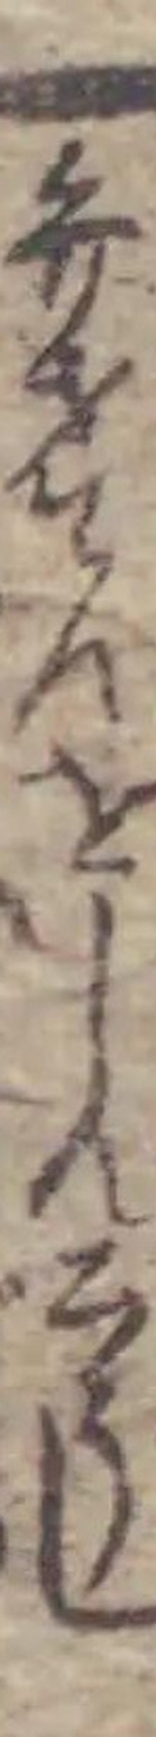弁才てんをしんこうし
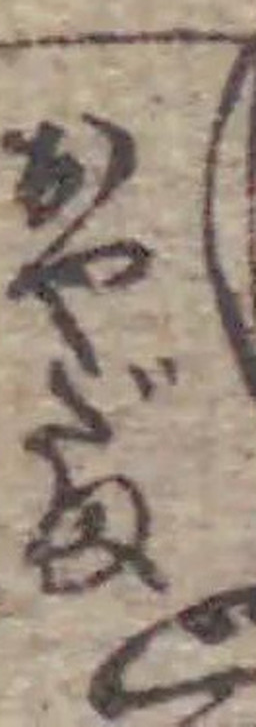おやだま
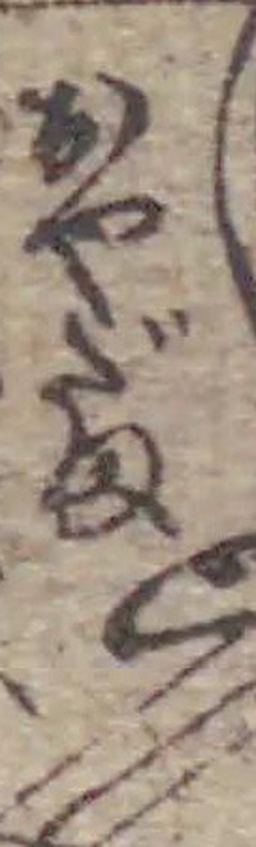おやだま
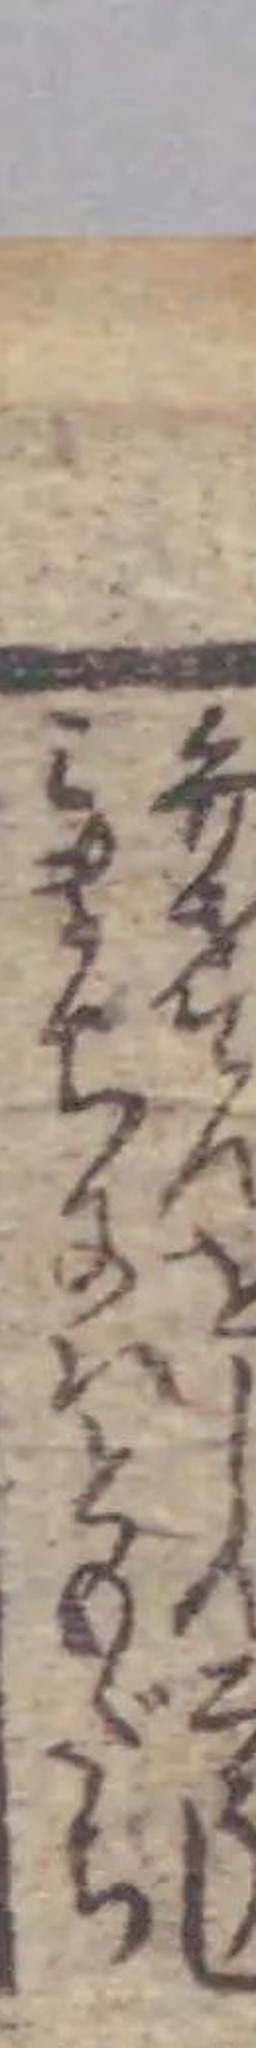みまちにはともだち
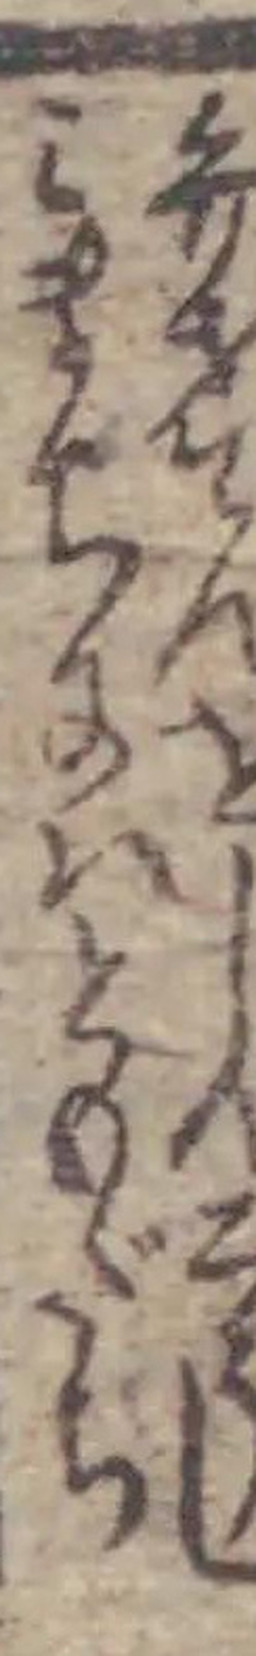みまちにはともだち
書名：日待御利生此ごろ噂 3巻
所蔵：国立国会図書館 National Diet Library, JAPAN
